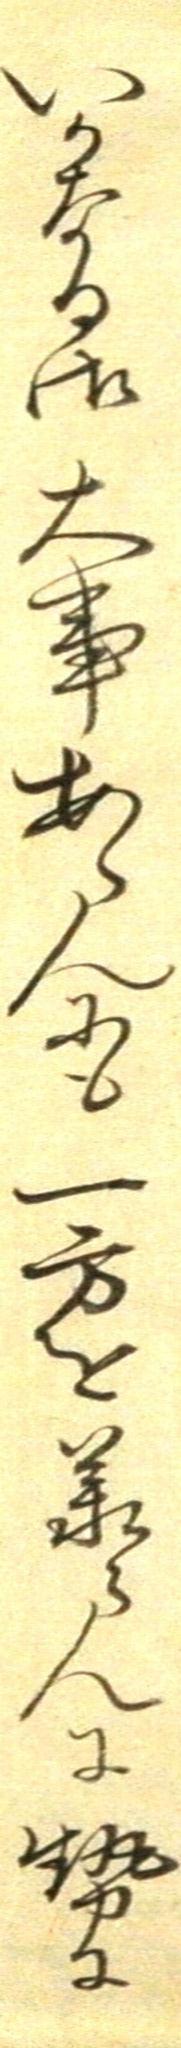いかなる御大事あらんにも一方を承らんに勢に
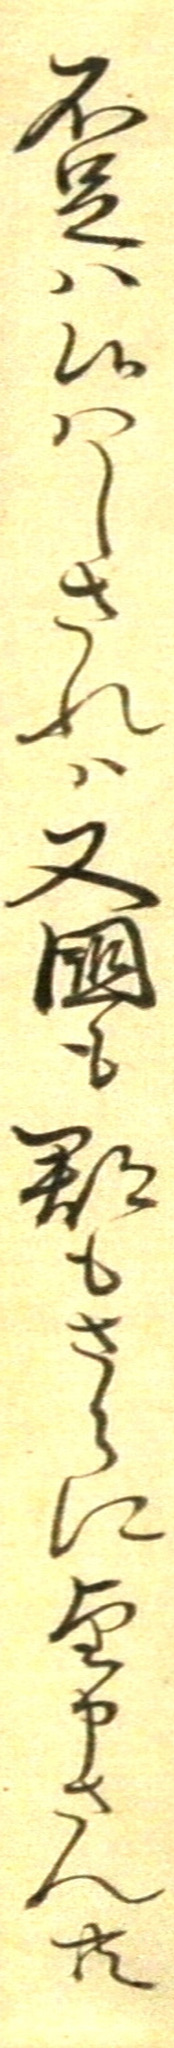不足は候はしされは又国も郡もさらに望申さん共

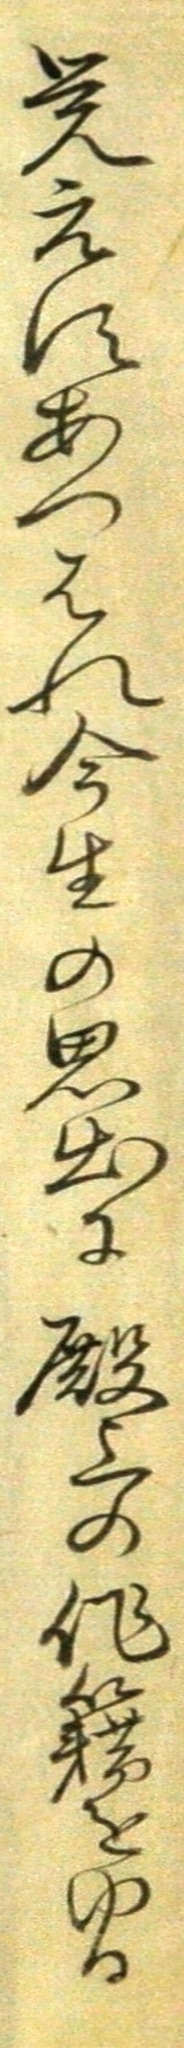覚えすあつはれ今生の思出に殿上の作籍をゆる
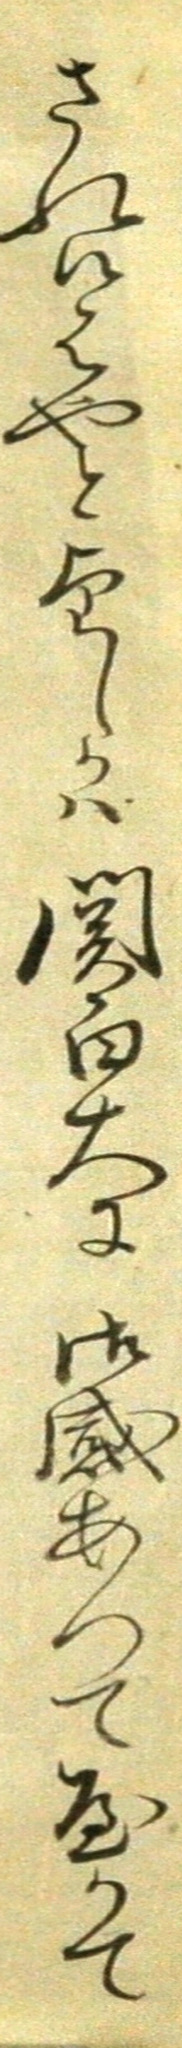され候はやと望しかは関白大に御感あつてやかて
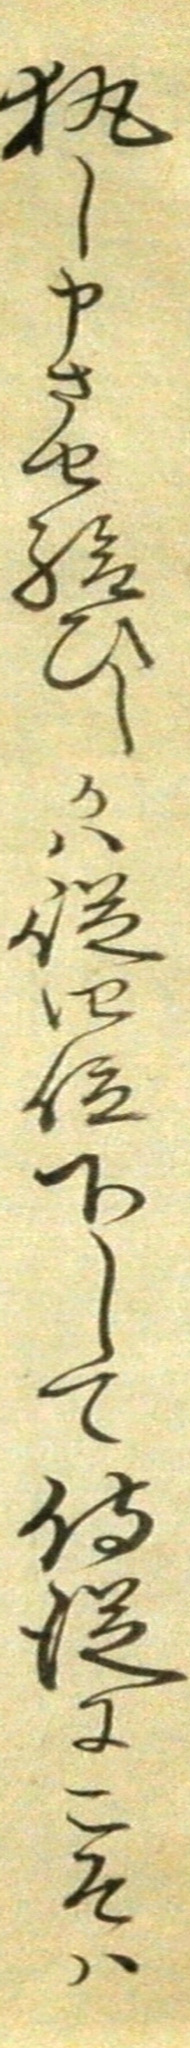執し申させ給ひしかは従四位下して侍従にこそは
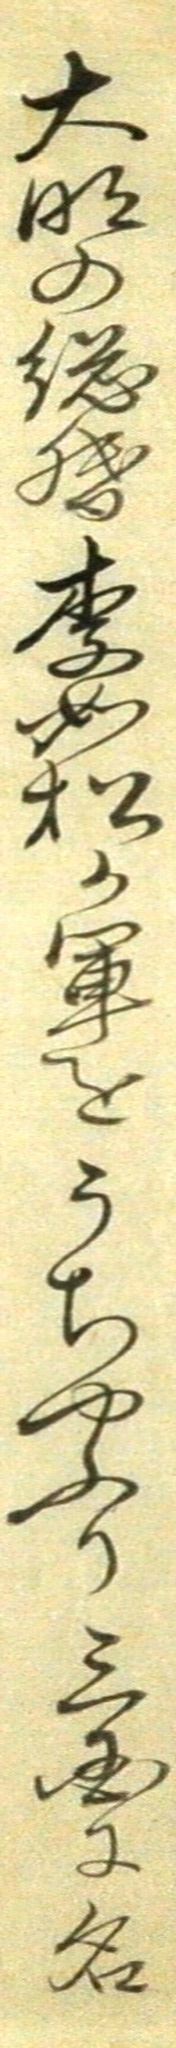大明の総督李如松か軍をうちやふり三国に名
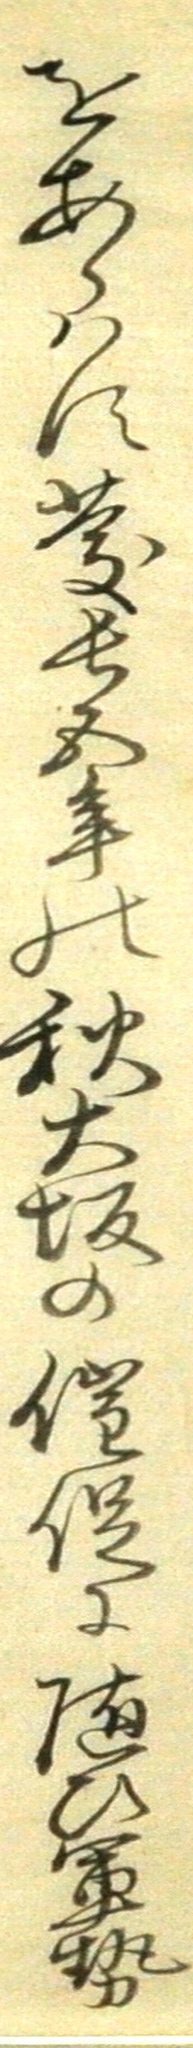をあらはす慶長五年の秋大坂の催促に随ひ軍勢
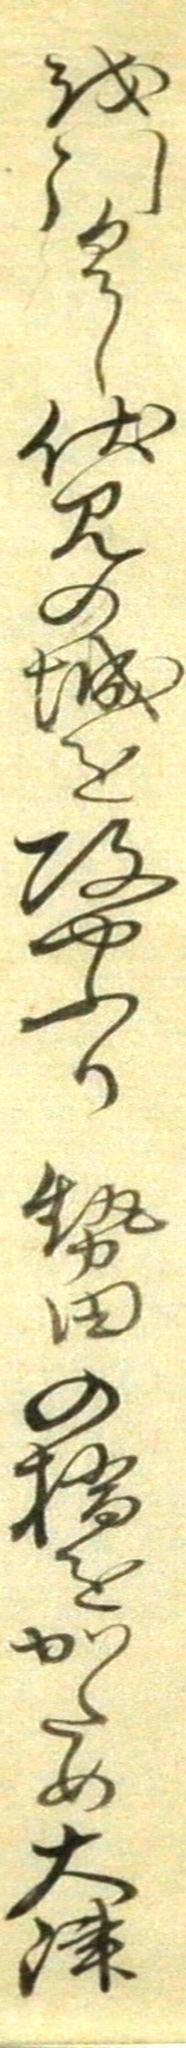を引具し伏見の城を攻やふり勢田の橋をかため大津
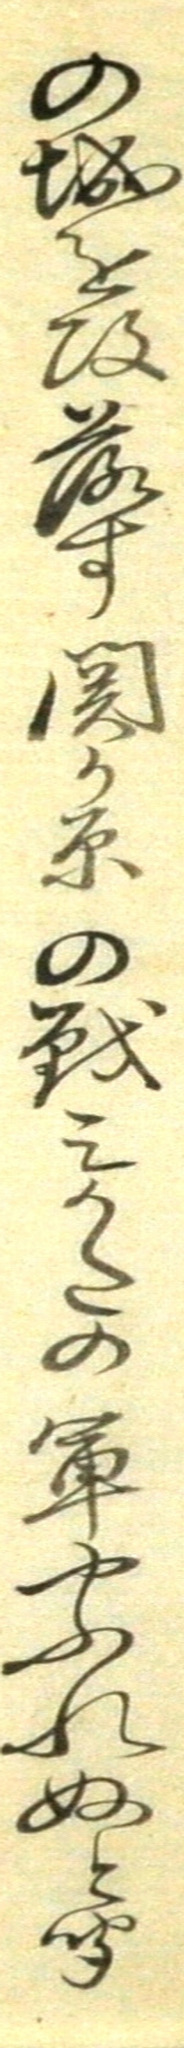の城を攻落す関か原の戦みかたの軍やふれぬと聞
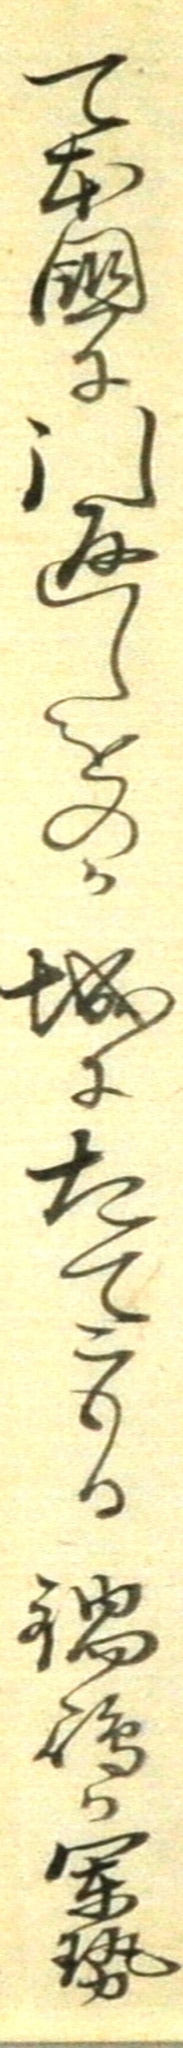て本国に引返しをのか城にたてこもる鍋島か軍勢
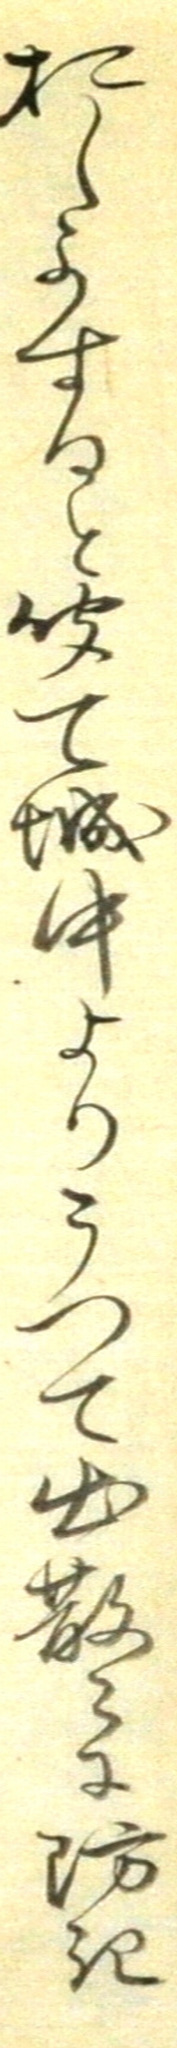おしよすると聞て城中よりうつて出散々に防き
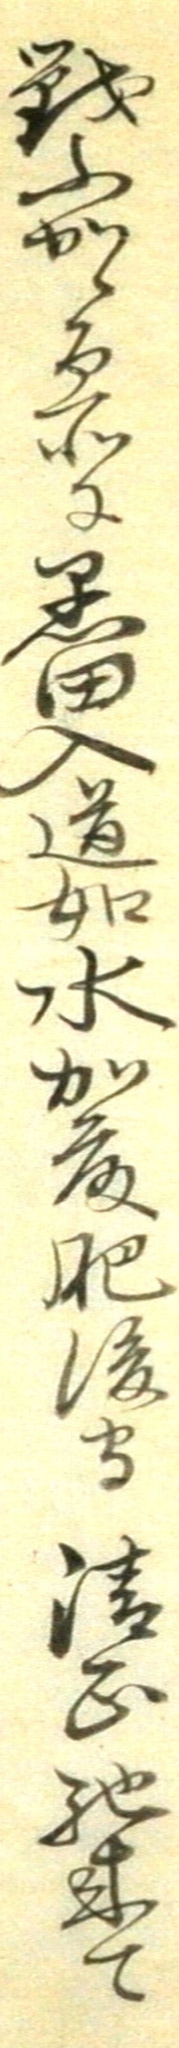戦ふかゝる所に黒田入道如水加藤肥後守清正馳来て
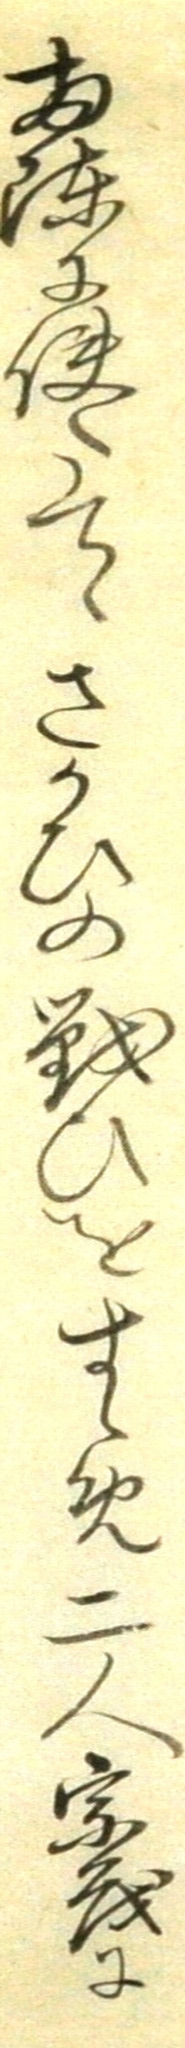両陣に使たてゝさかひの戦ひをすゝめ二人宗茂に
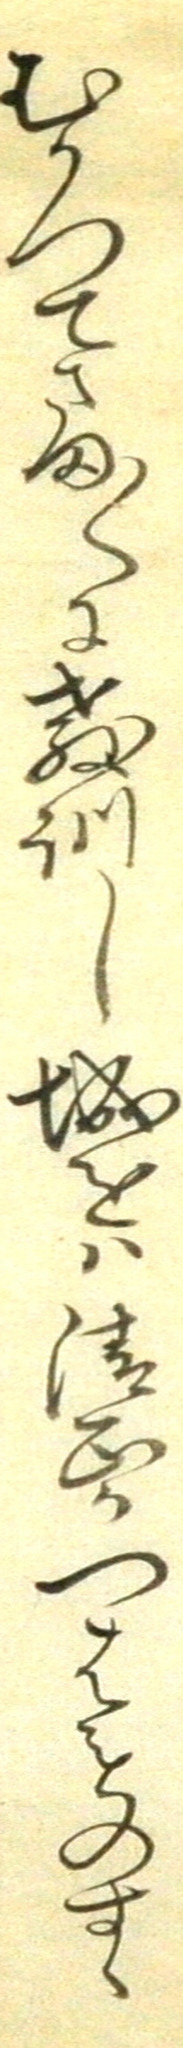むかつてさま〳〵に教訓し城をは清正かつはものすゝ
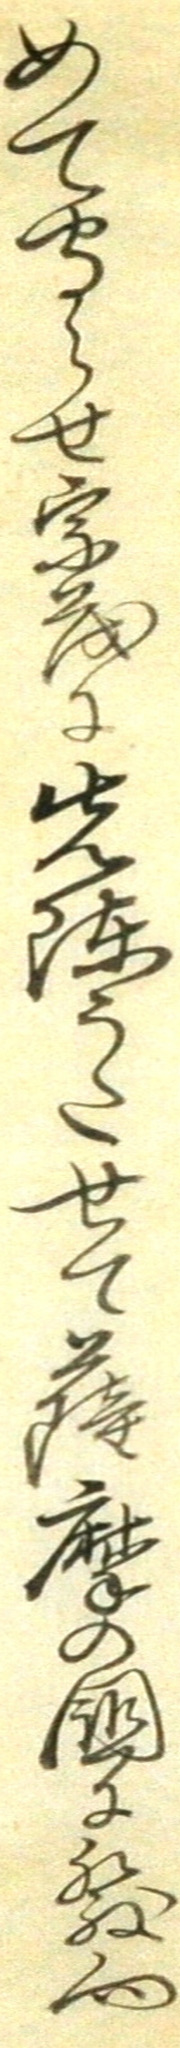めて守らせ宗茂に先陣うたせて薩摩の国に発向
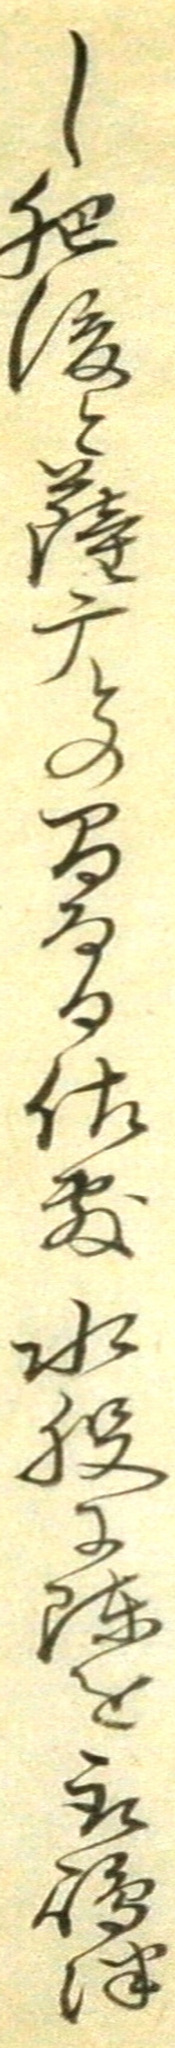し肥後と薩摩との間なる佐敷水俣に陣を取島津
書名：藩翰譜（八・下）
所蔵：伊那市立高遠町図書館・合同会社AMANE
